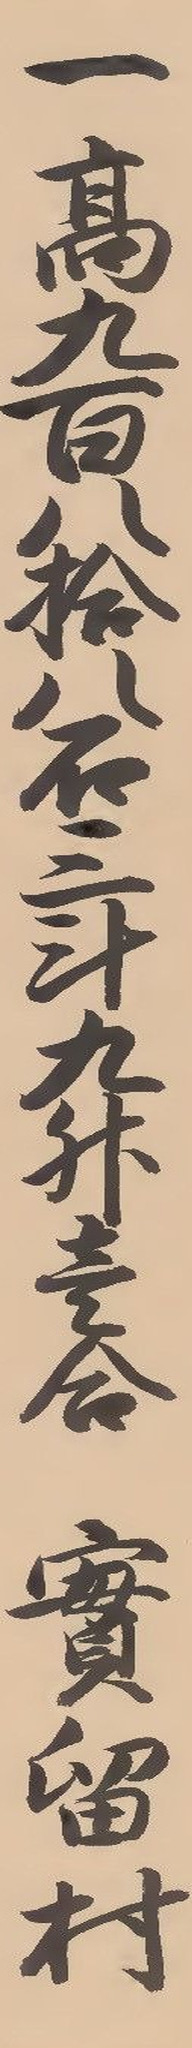一高九百八拾八石三斗九升壱合実留村
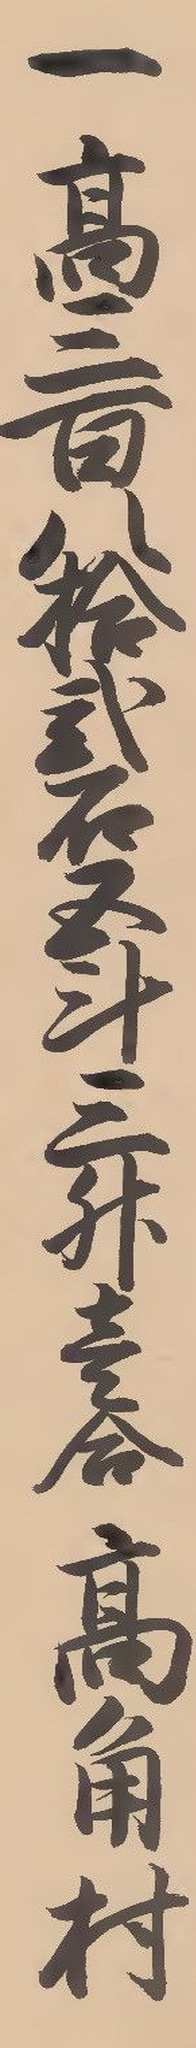一高三百八拾弐石五斗三升壱合高角村
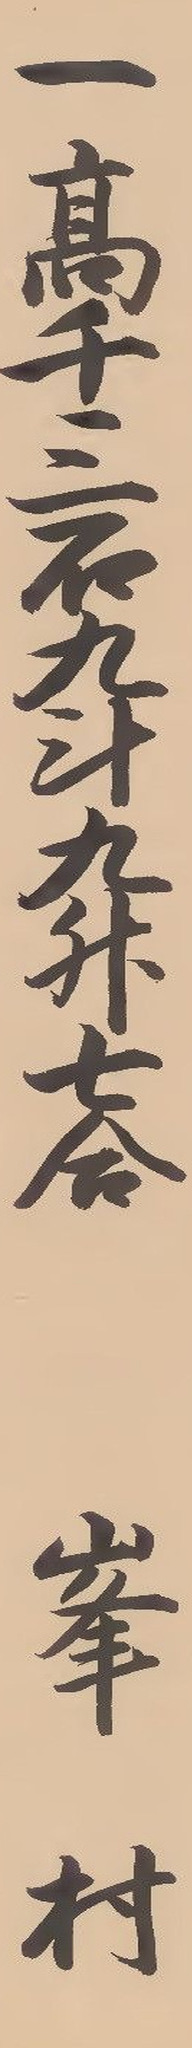一高千三石九斗九升七合峰村
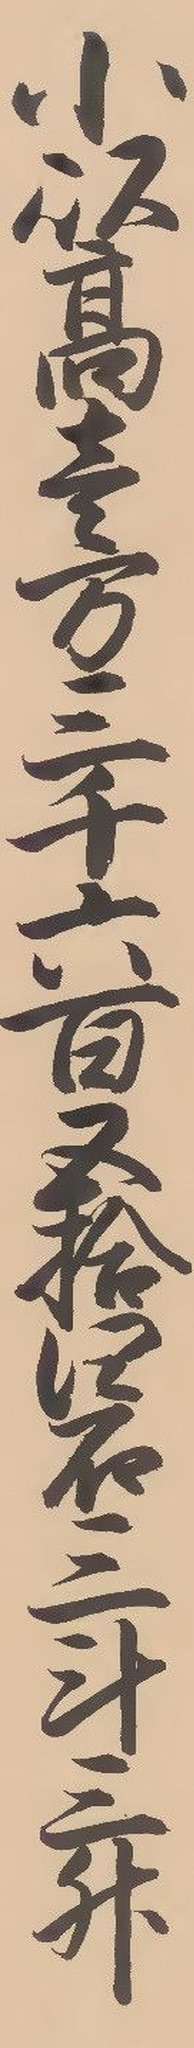小以高壱万三千六百五拾四石三斗三升

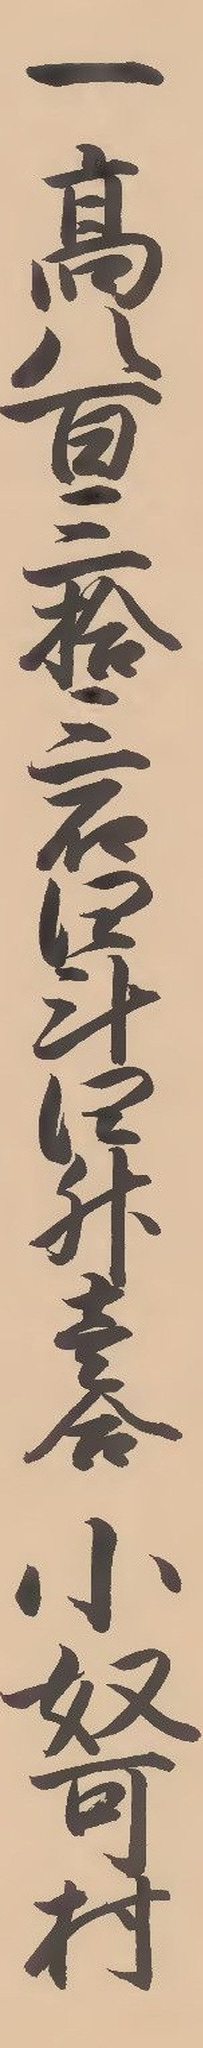一高八百三拾三石四斗四升壱合小奴可村
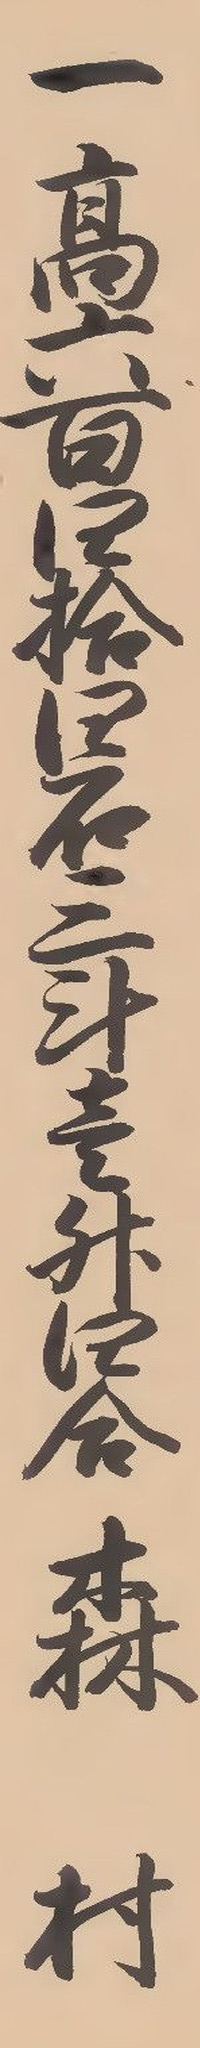一高六百四拾四石三斗壱升四合森村
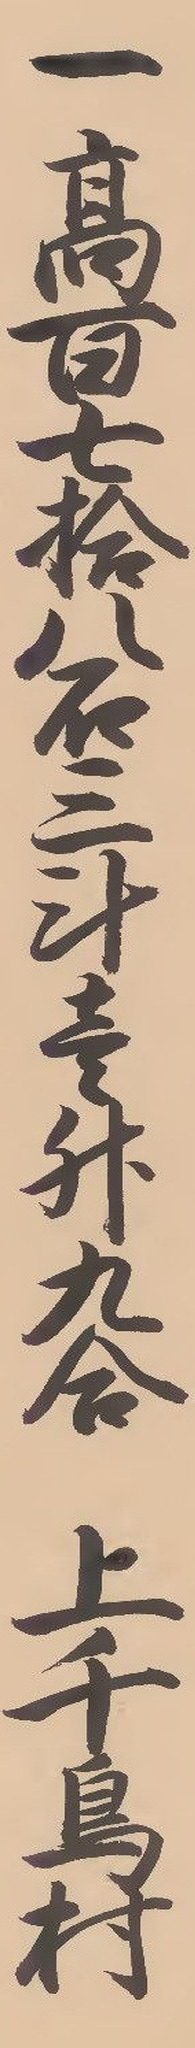一高百七拾八石三斗壱升九合上千鳥村

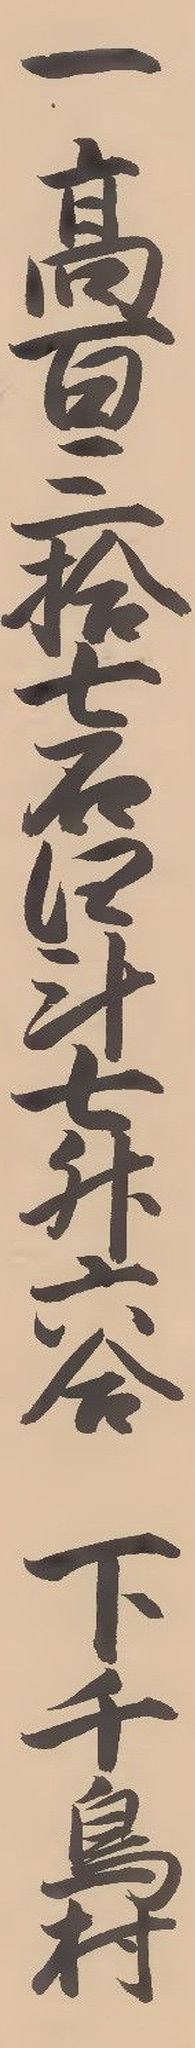一高百三拾七石四斗七升六合下千鳥村
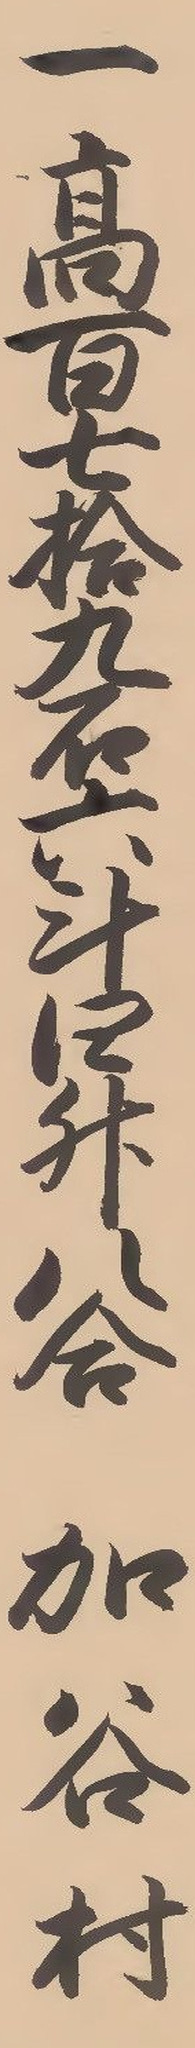一高百七拾九石六斗四升八合加谷村
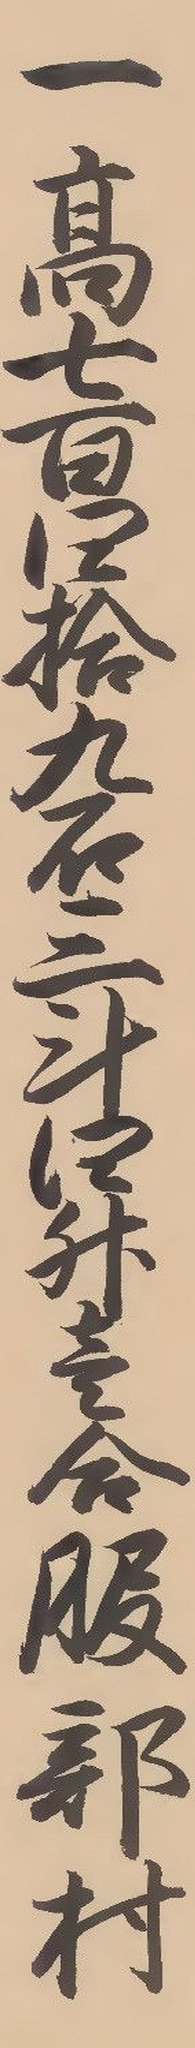一高七百四拾九石三斗四升壱合服部村
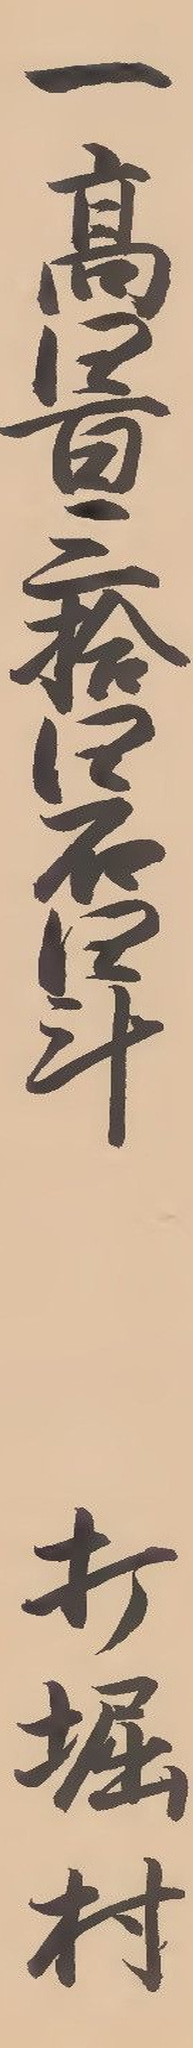一高四百三拾四石四斗打堀村
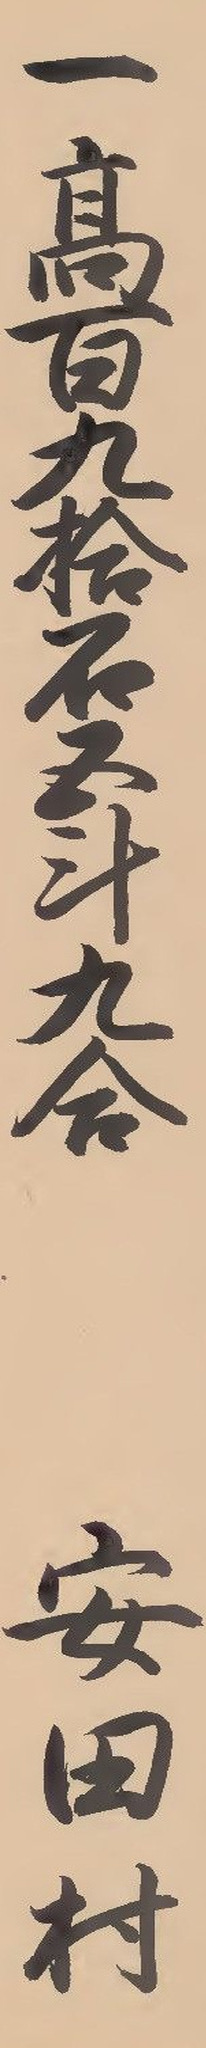一高百九拾石五斗九合安田村
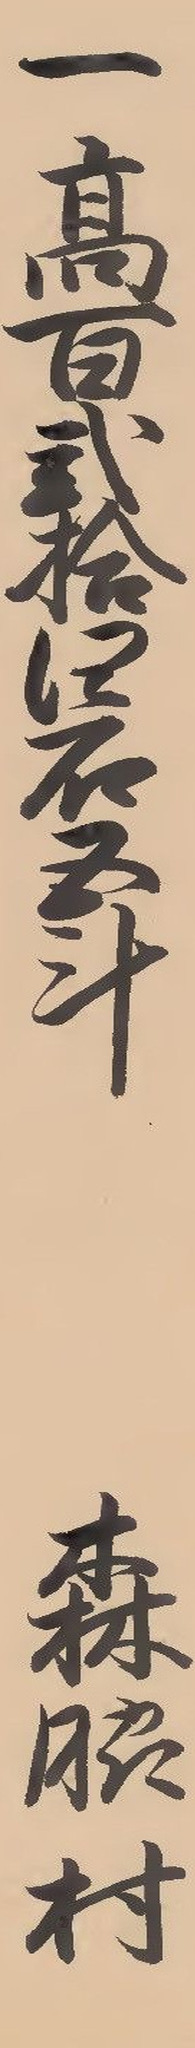一高百弐拾四石五斗森脇村
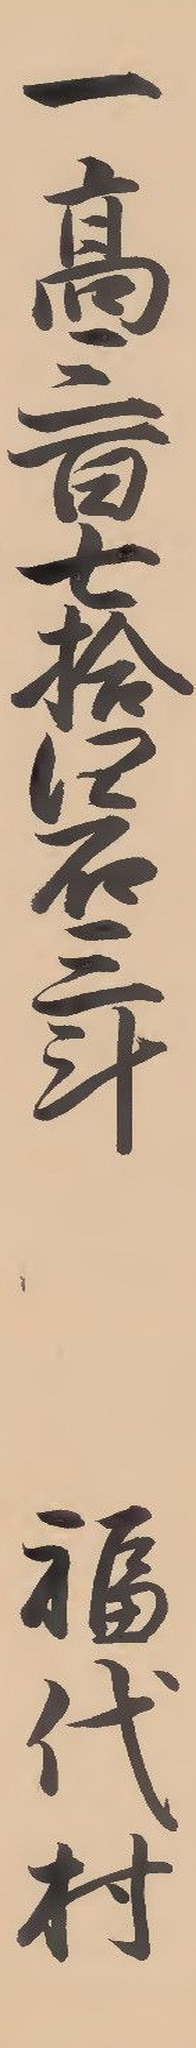一高三百七拾四石三斗福代村
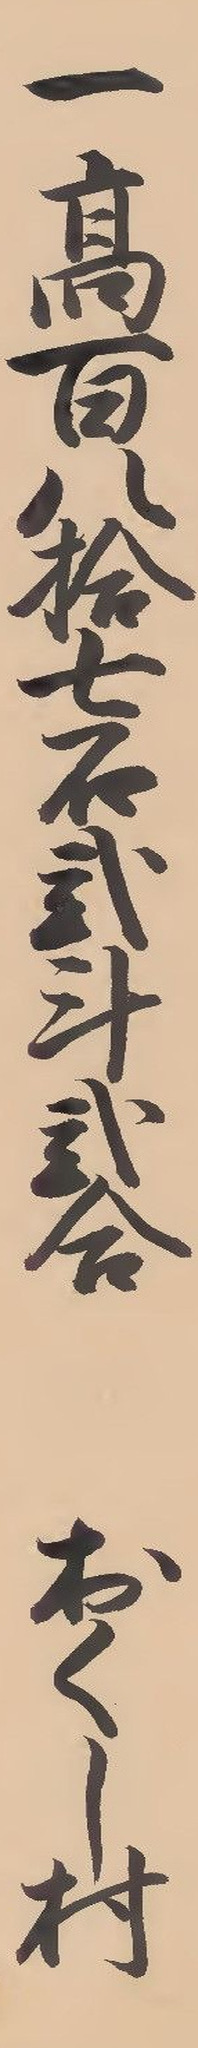一高百八拾七石弐斗弐合おくし村

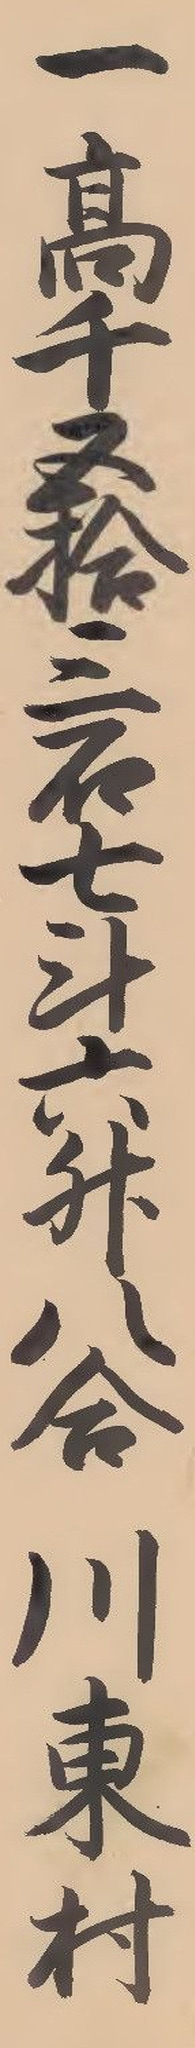一高千五拾三石七斗六升八合川東村
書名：備後国郷帳
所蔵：国立公文書館 National Archives of Japan
